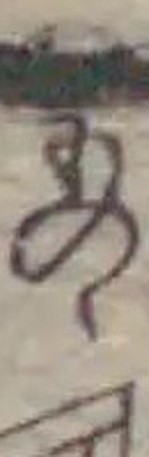ものゝ
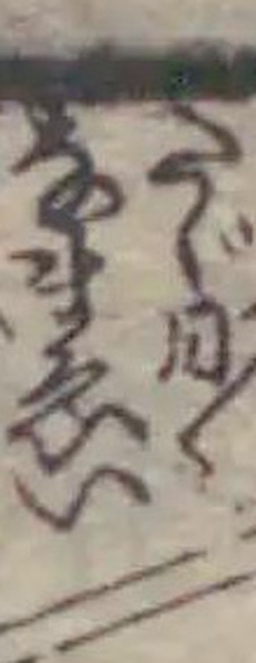なまゑい
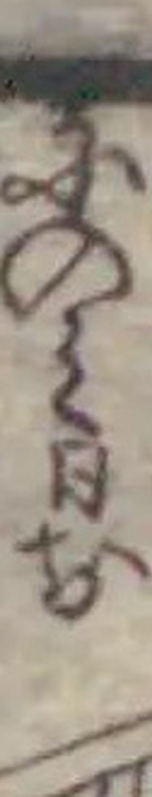にのみ日お
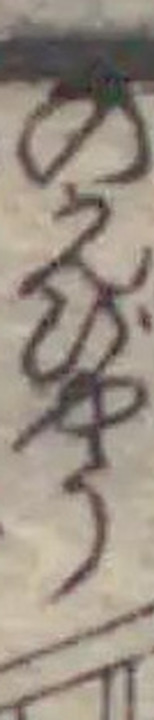のかんびやう
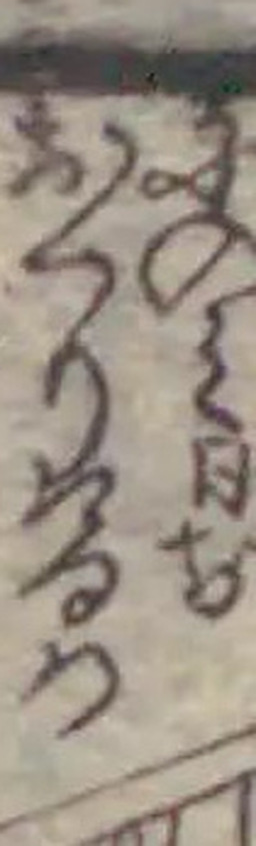おくりけるか
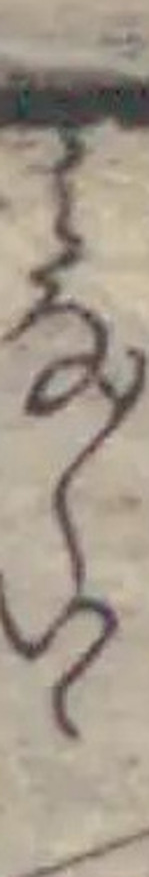みな〳〵いゝ
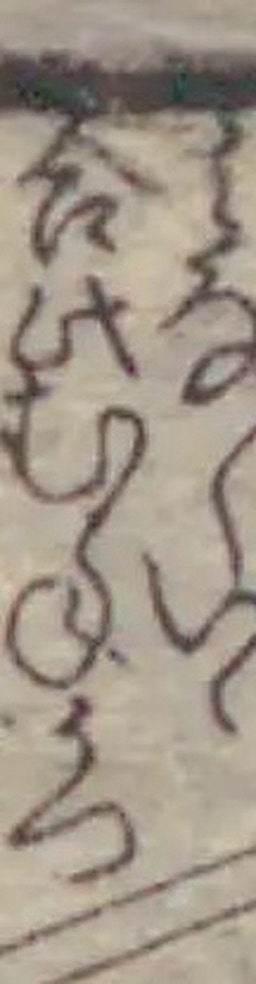合此むねうつ
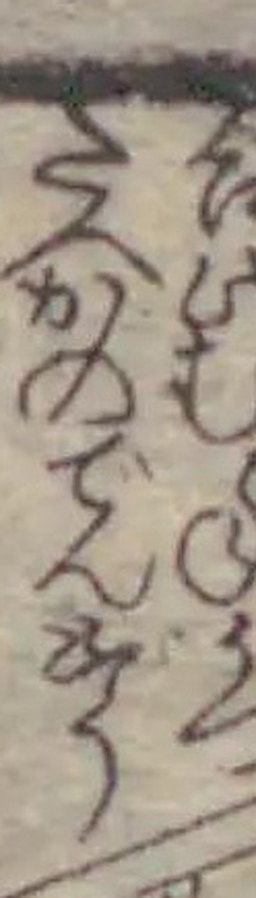たへかのでんどう
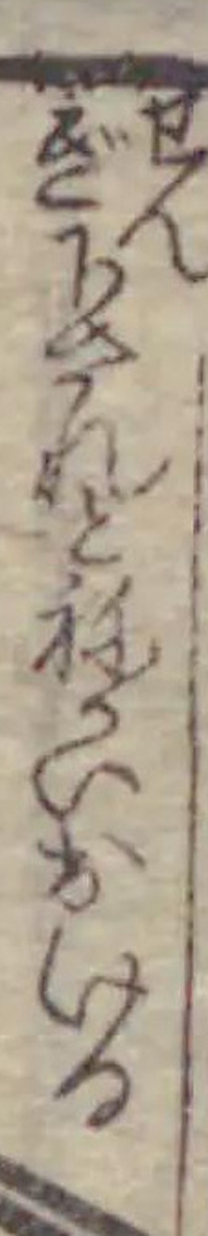ぎ下されとねかい出ける
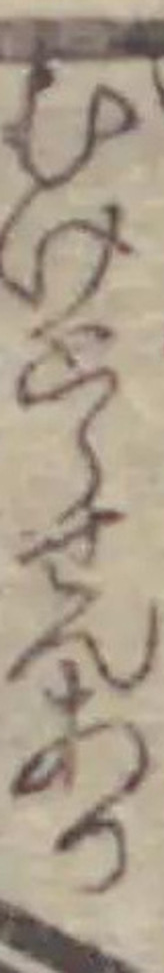むけとらせんあり
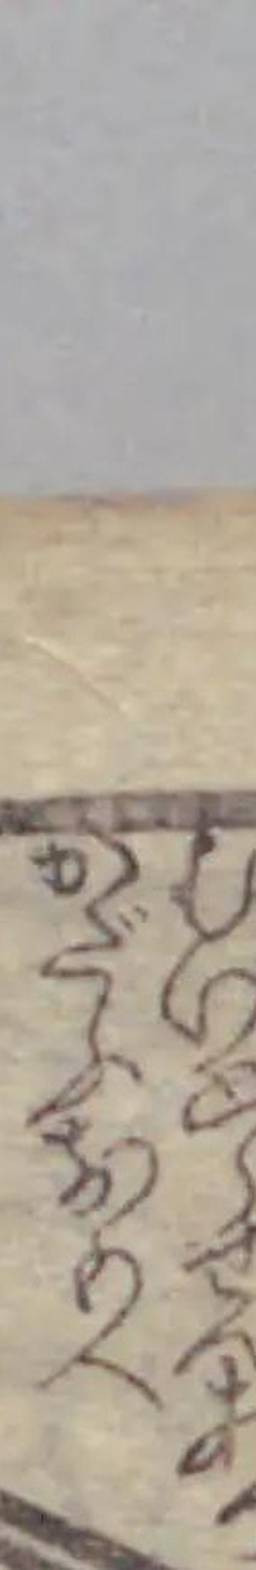かだふおもへ
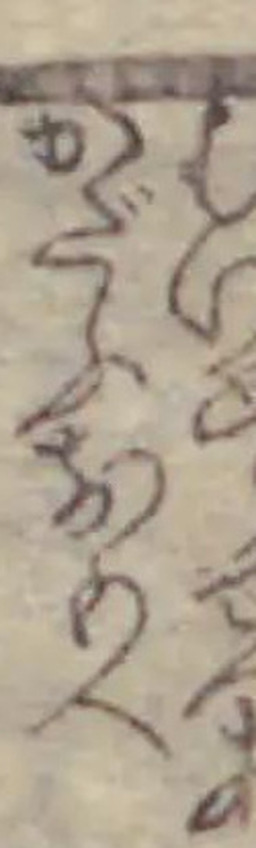かだふおもへ
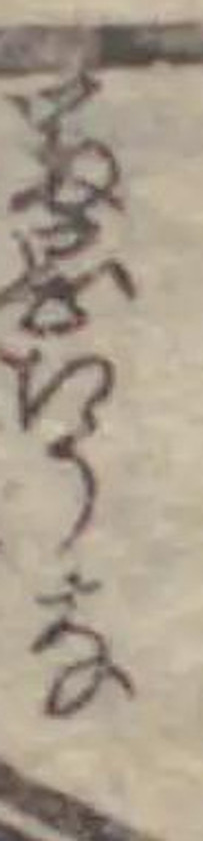富岡ちうな
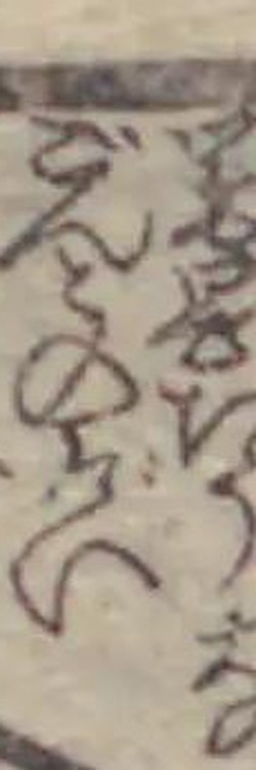ごんとのげい
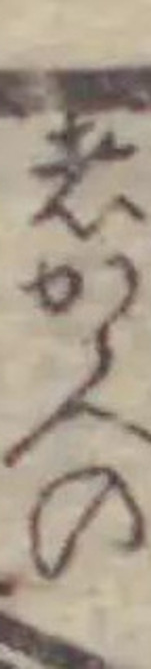者かゝへの
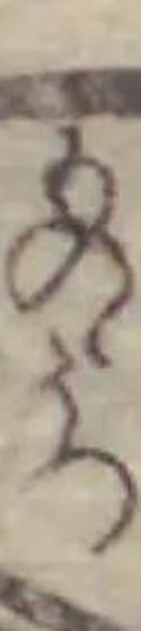ものゝうつ
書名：藝者五人娘 2巻
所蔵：国立国会図書館 National Diet Library, JAPAN
